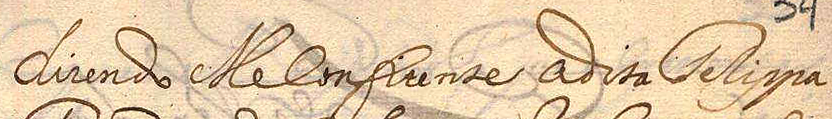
dizendo elle confitente a dita Felippa
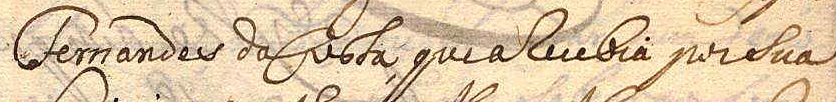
Fernandes da Costa, que a Recebia por Sua
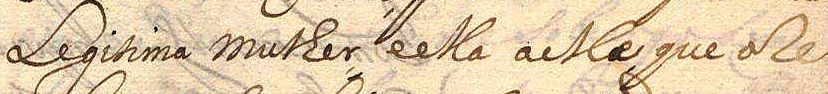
Legitima mulher, e ella a elle que o Re
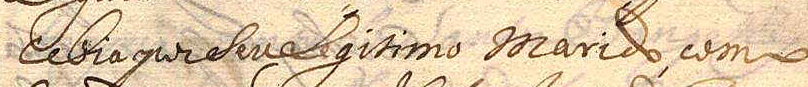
cebia por seu Legitimo marido, como
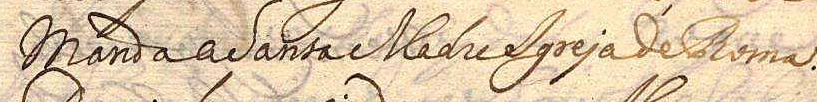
Manda a Santa Madre Igreja de Roma.
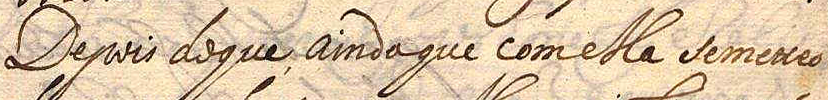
Depois do que, ainda que com ella se metteo
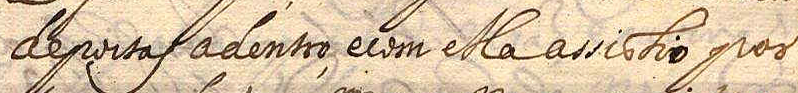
de portas adentro, e com ella assistio por
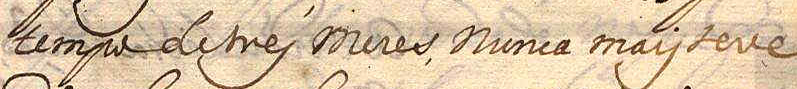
tempo de tres mezes, nunca mais teve
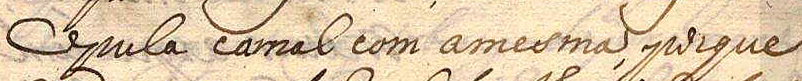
Copula carnal com a mesma, porque
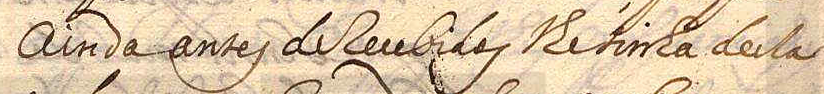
ainda antes de Recebidos lhe tinha decla
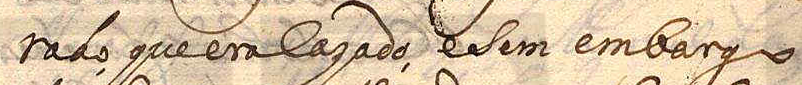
rado que era Cazado, e sem embargo
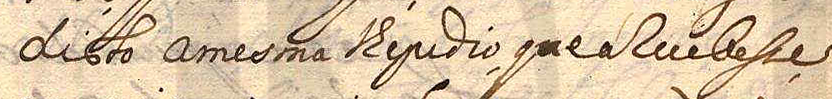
disto a mesma lhe pedio, que a Recebesse,
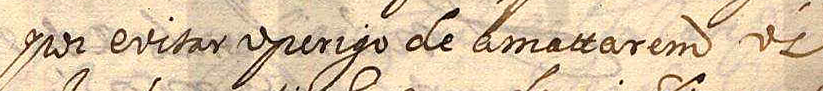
por evitar o perigo de a mattarem os
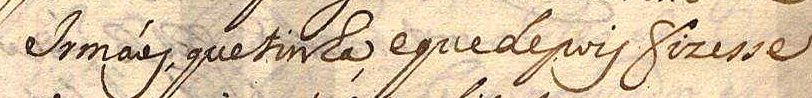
Irmaõs, que tinha, e que depois fizesse
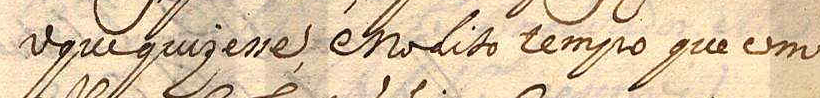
o que quizesse, e no dito tempo que com
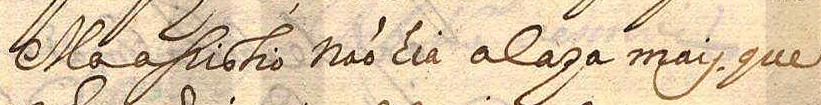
ella assistio naõ hia a Caza mais, que
